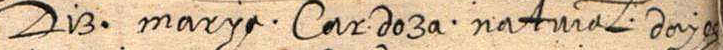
Diz. marya. Cardoza. naturaL. da ylh
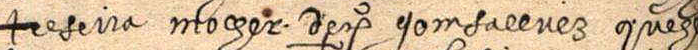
treseira molher. de po gomsalluez que he
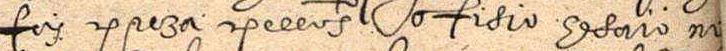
foy preza pello sto ofisio he saio no
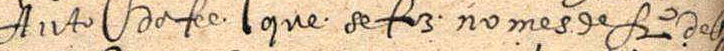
Auto da fee que. se fez. no mes de fro des
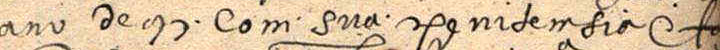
ano de 97. com. sua. penitemsia e fo
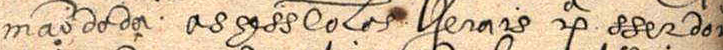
mãodada as hescoLas Jerais pa sser do
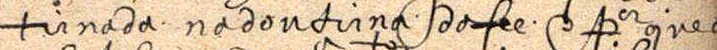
trinada na doutrina da fee. e por que a
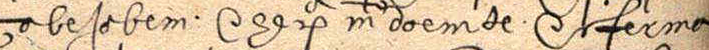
sabe Ja bem e he pa mto doemte e eferma
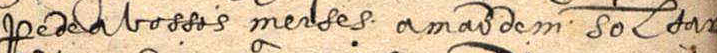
pede a vossas merses a mãodem soLtar
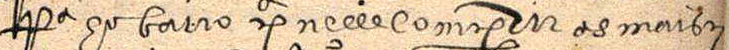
pa ho bairo pa nelle comprir as mais
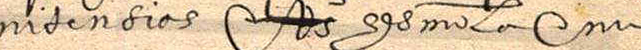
nitensias e Rꝭo hesmoLa e mr
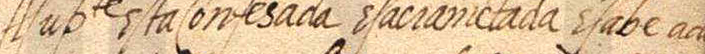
A supte Esta Confesada E sacramētada E sabe a d
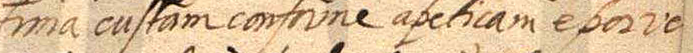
trina cristam conforme a petiçam e por ve
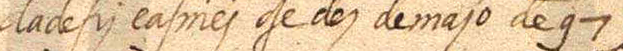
dade fiz e asinej oJe dez de majo de 97
